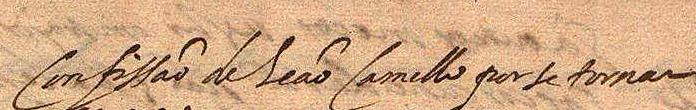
Confissaõ de Leaõ Camello por se tornar
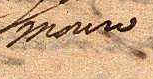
mouro
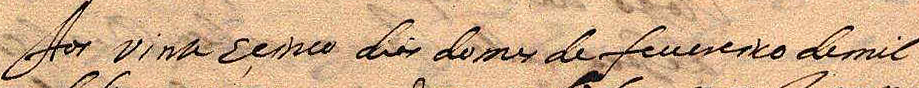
Aos vinte E cinco dias do mes de feuereiro de mil
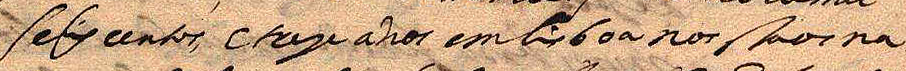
seiscentos, e treze anos em lisboa nos staos na
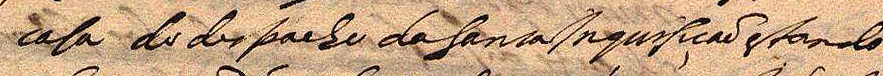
casa do despacho da santa Inquisiçaõ estando
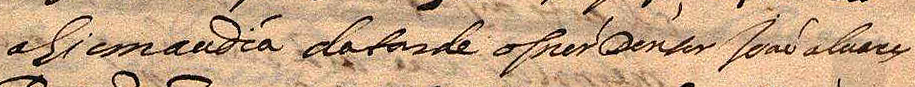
ahi em audiā da tarde o snor̄ Doutor Joaõ aluares
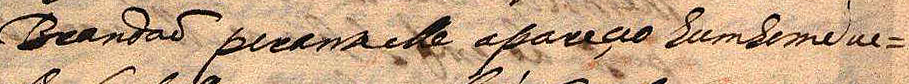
Brandaõ perante elle apareceo hum homē ue
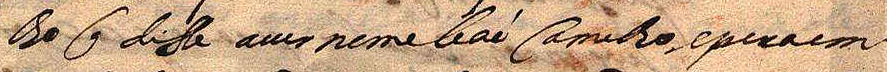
lho q̄ disse auer nome leaõ Camelho, e pera em
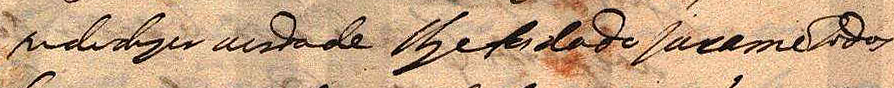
tudo dizer uerdade lhe foi dado Juramēto dos
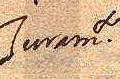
Juram.to
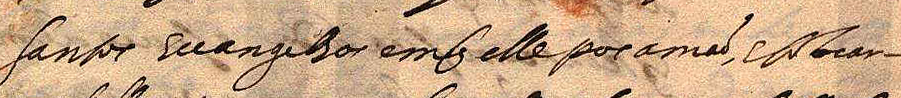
Santos Euangelhos em q̄ elle pos a maõ, E sob car
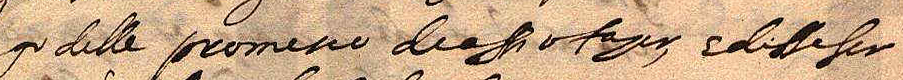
go delle prometeo de assi o fazer, E disse ser
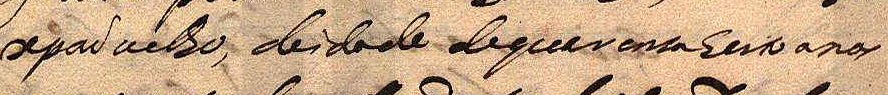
xpaõ uelho, de idade de quarenta E oito anos
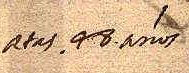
atas. 48 an̄os
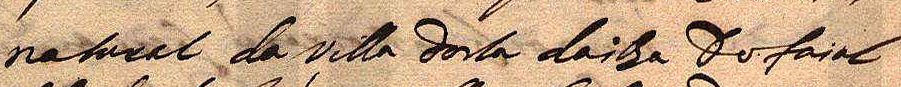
natural da villa dorta da ilha do faial
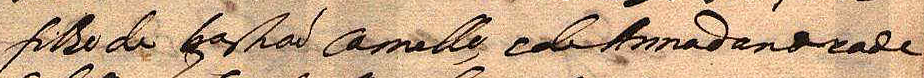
filho de bastiaõ camello, e de Anna dandrade
